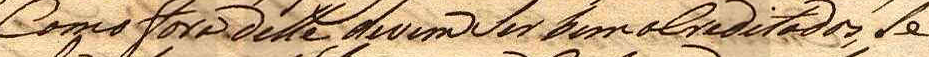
Como fora delle devem ser bem aCreditados, se
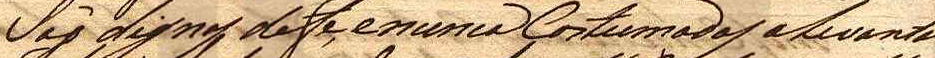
saõ dignas de fe, e nunca Costumadas a levanta
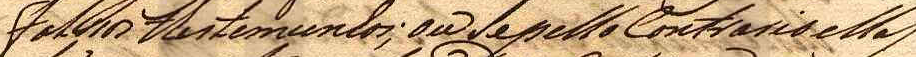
falssos testemunhos; ou se pello Contrario ellas
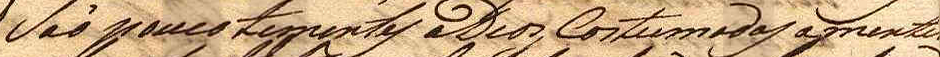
Saõ pouco tementes a Deos, Costumadas a menti
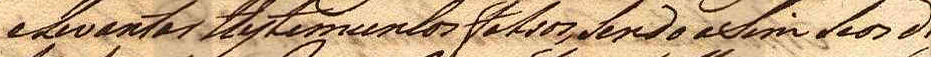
e levantar testemunhos falsos, sendo aSim seos d_
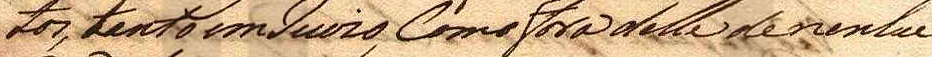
tos, tanto em Iuizo, Como fora delle de nenhu_
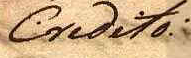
Credito:
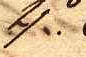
4.o
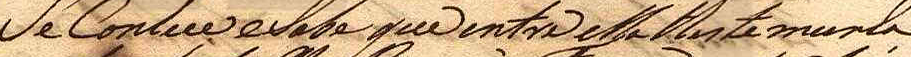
Se Conhece, e Sabe que entre ella thestemunha,
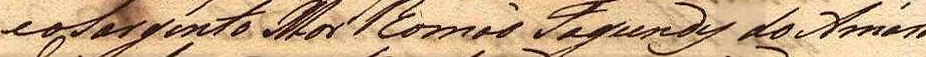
e o sargento Mor Romaõ Fagundes do Amara
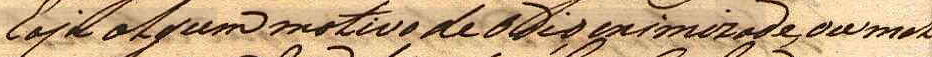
haja algum motivo de odio, enimizade, ou mal
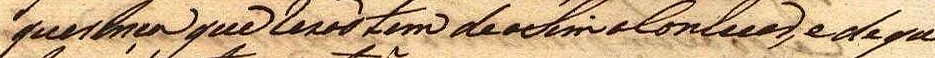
querença que Rezaõ tem de aSim a Conhecer, e de qu
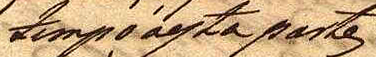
tempo á esta parte.
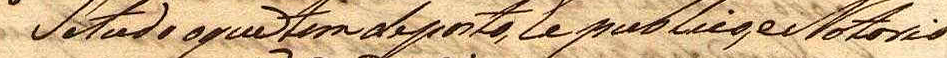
Se tudo o que tem deposto, he publico, e Notorio
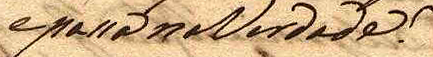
e passa na Verdade.
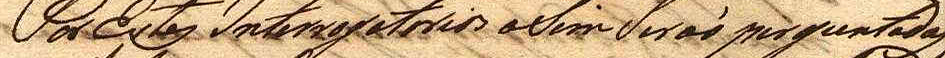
Por Estes Interrogatorios aSim serão perguntadas
